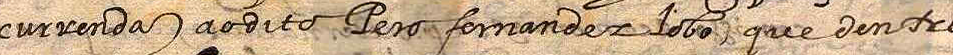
currenda ao dito Pero fernandez lobo, que dentro
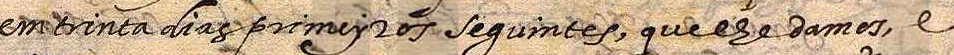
em trinta dias primeyros seguintes, que lhe damos, e
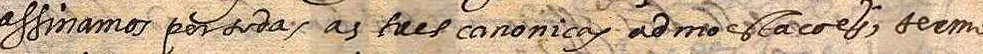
assinamos per todas as taes canonicas admoestações, termo
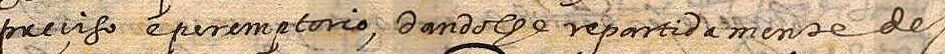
preciso e peremptorio, dandolhe repartidamente dez
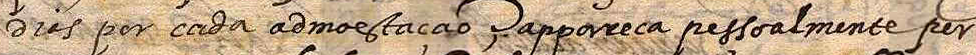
dias por cada admoestaçaõ, appareça pessoalmente per
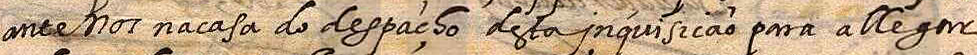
ante nos na casa do despacho desta jnquisiçaõ para allegar
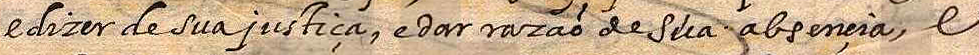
e dizer de sua justiça, e dar razaõ de sua absencia, e
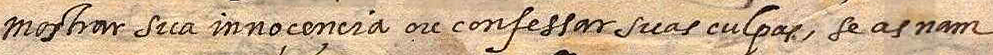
mostrar sua innocencia ou confessar suas culpas, se as nam
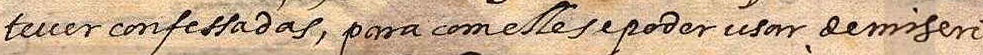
teuer confessadas, para com elle se poder usar de miseri
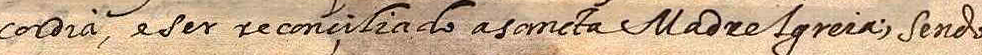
cordia, e ser reconciliado a sancta Madre Igreja; sendo
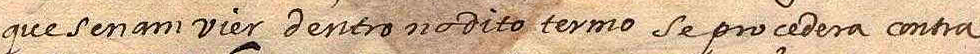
que se nam vier dentro no dito termo se procedera contra
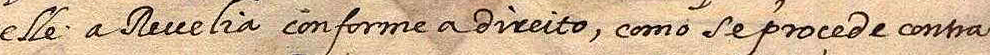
elle a Reuelia conforme a direito, como se procede contra
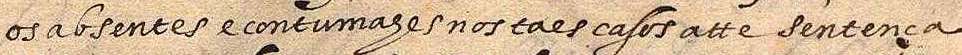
os absentes e contumazes nos taes casos atte sentença
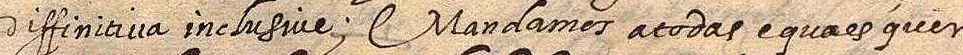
diffinitiua inclusiue; e Mandamos a todas e quaesquer
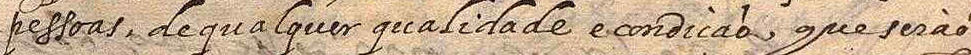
pessoas, de qualquer qualidade e condiçaõ que seraõ
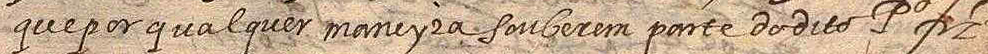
que por qualquer maneyra souberem parte do dito Po frz̄
